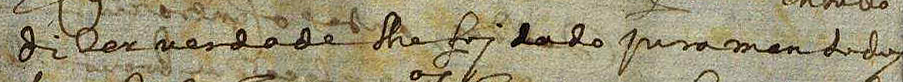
dizer uerdade lhe foj dado juramento dos
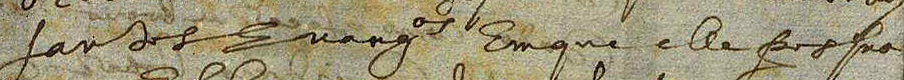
santos Euangos Em que elle pos sua
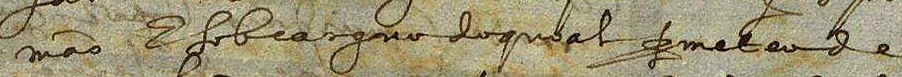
mão E sob carguo do qual ꝓmeteo de
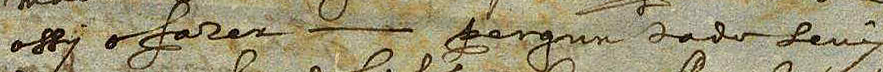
assy o fazer - perguntado se cuj
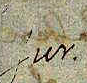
Jur.
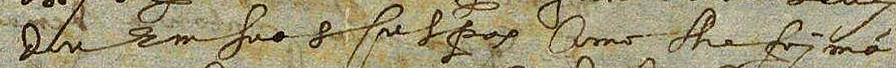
dou Em suas Culpas como lhe foj mā
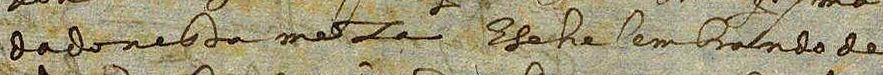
dado nesta meza E se he lembrando de
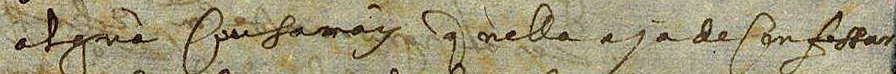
alguā Cousa mais q̄ nella aja de Confessar
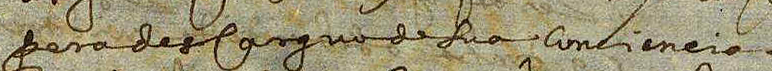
pera desCarguo de sua conciencia
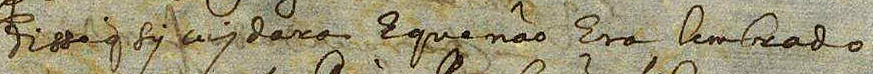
disse q̄ sy cuidara E que não Era lembrado
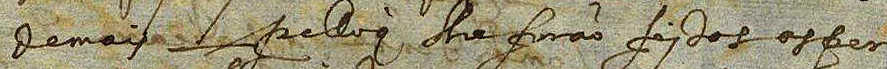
de mais - pello q̄ lhe foraõ feitas as per
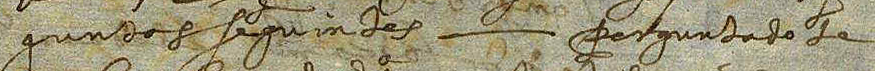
guntas seguintes - perguntado se
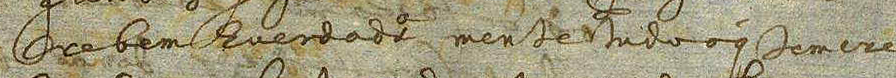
cre bem E uerdadramente tudo o q̄ tem cre
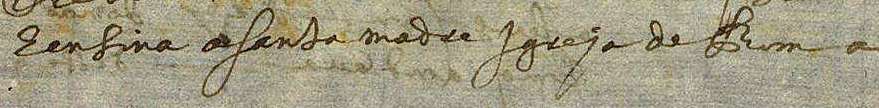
E ensina a santa madre Jgreja de Roma
